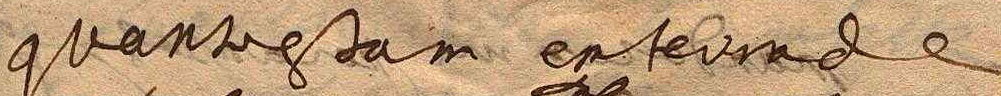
quanto estam em terra de
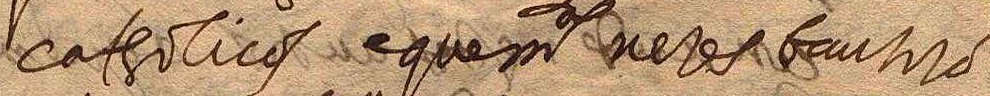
catholicos e que mtas uezes bautizō
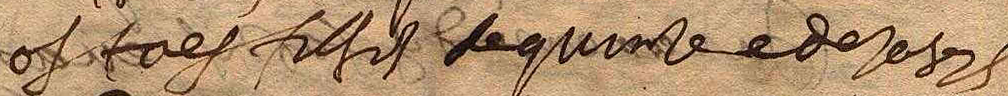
os taes filhos de quinze e dezasejs
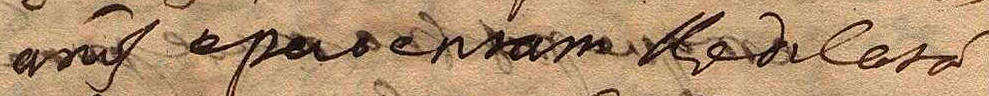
anōs e pero entam lhe dilatā
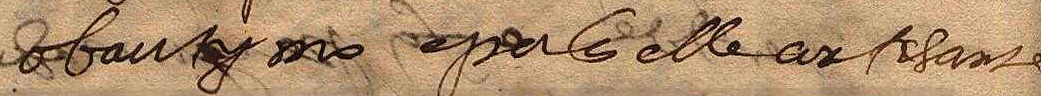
o bautismo e porq̄ elle confesante
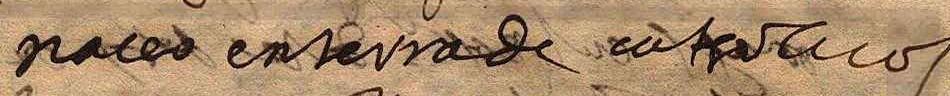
naceo en terra de catholicos
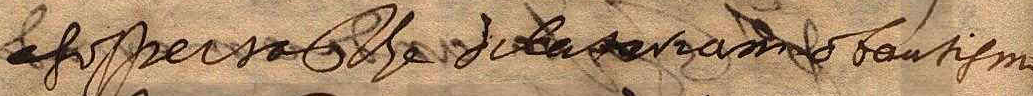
e sospeita q̄ lhe dilatariam o bautismo
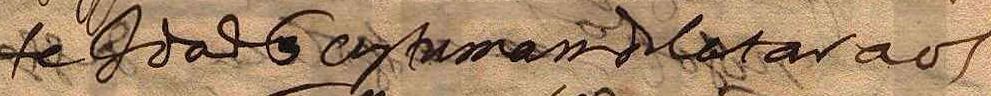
te Jdade q̄ custumam dilatar aos
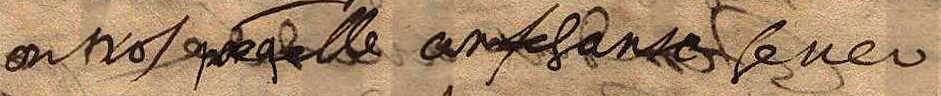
outros porq̄ elle confesante se ueo
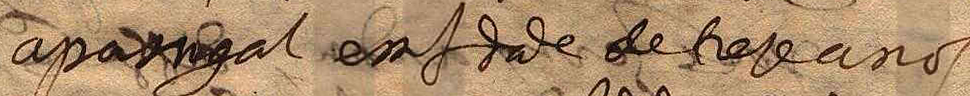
a portugal em Jdade de treze anos
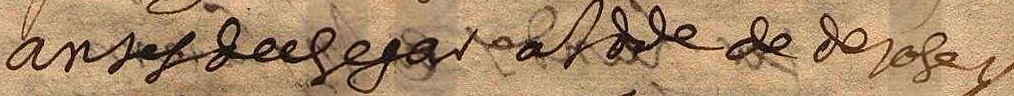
antes de chargar a Jdade de dezaseis
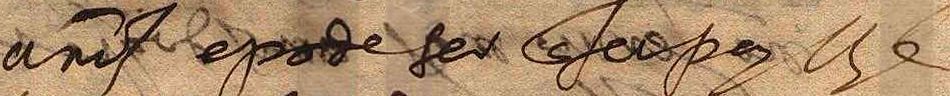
anōs e pode ser q̄ seu paj lhe
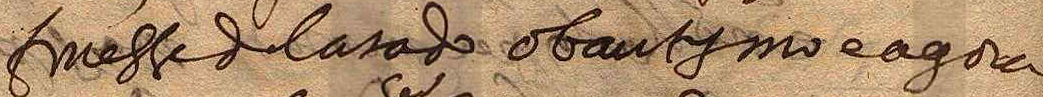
tiuesse dilatado o bautismo e agora
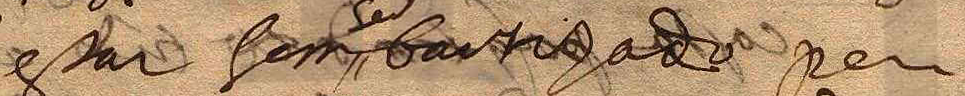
estar sem ser baurizado per
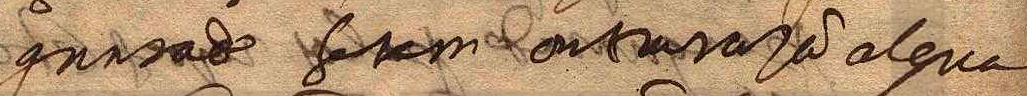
guntado se tem outra razā algua
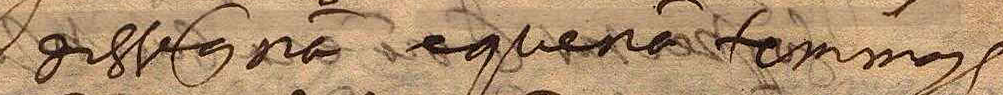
disse q̄ nā e que nā tem majs
